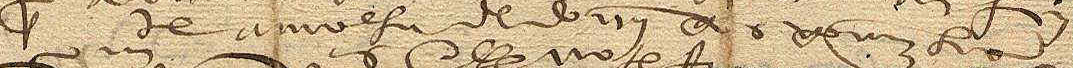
somte a molher de domj̄gos gomez huā
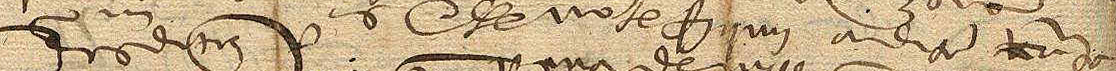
das ditas pas e lhe notefyquej a dita carta
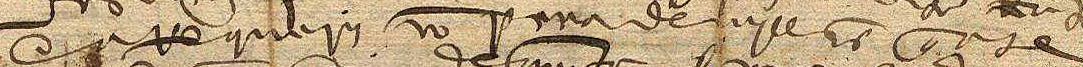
e a Requery c̄o pena de mjll r̄s q̄ ate
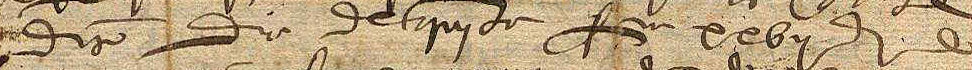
dito dia de quj̄ta fra xxbij dj do
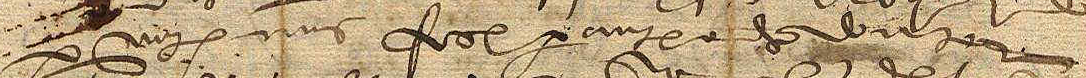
ꝑsente mes fose ꝑante o dto doutor
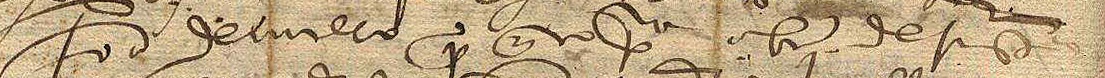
Joā de mello p̄oq̄ c̄op̄a a bē de Justa
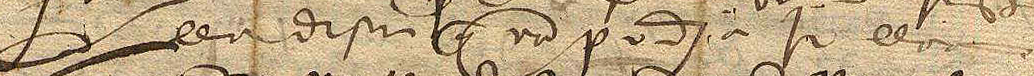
e ella dise q̄ nā podja Jr llaa
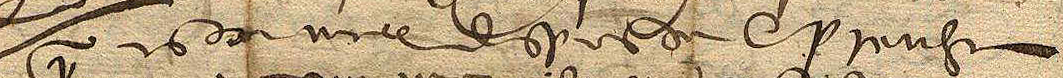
p̄o estar mall desposta e prenha
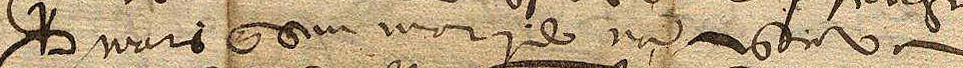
e mais q̄ seu marjdo nā estava
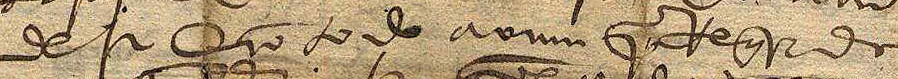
de Jr e c̄otodo a ouue p̄o Req̄rida
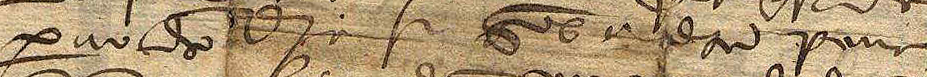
ꝑa o dto dja Jr sob a dita pena
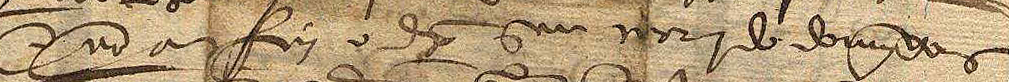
e nā achey o dt̄o seu marjdo domj̄gos
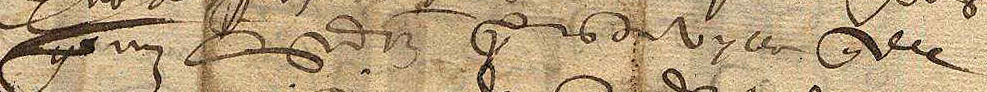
gomez e se diz p̄o esta vylla q̄ elle
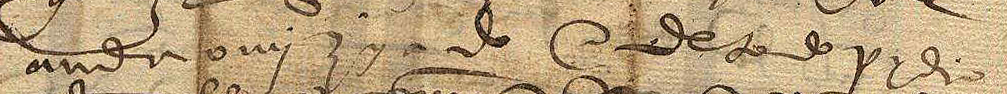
anda omjzyado e de todo pydio
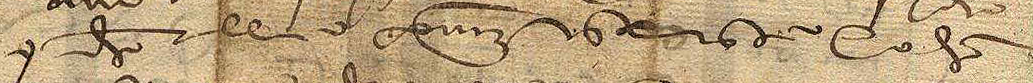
o dto alluo gomez este esto e o dto
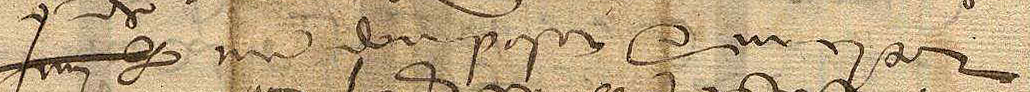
Juiz lho mādou pasar e eu ejtor
